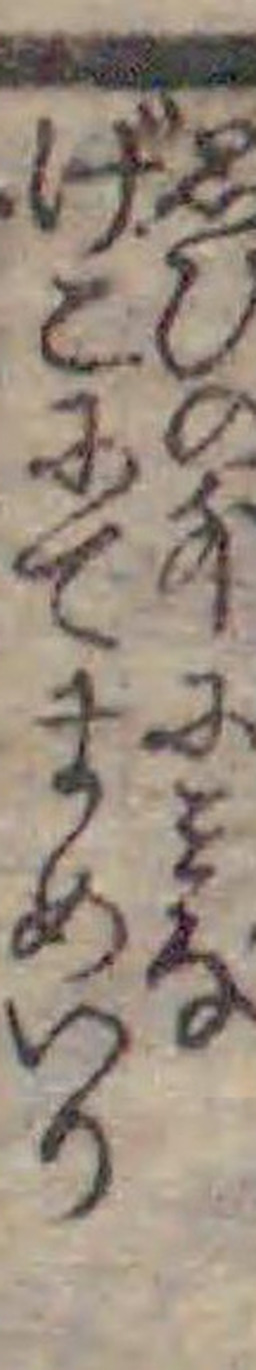げこにてまめいり
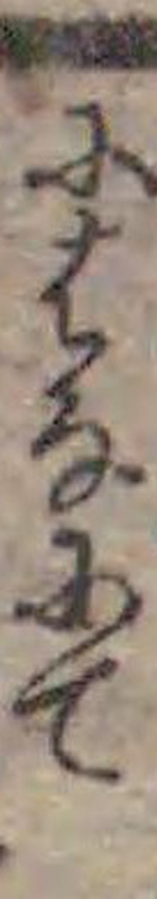にはなにて
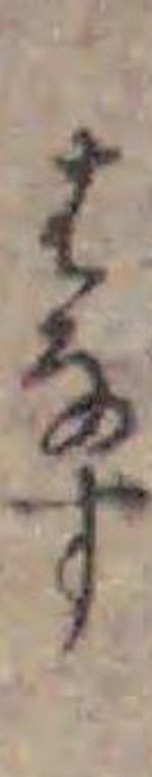はなす

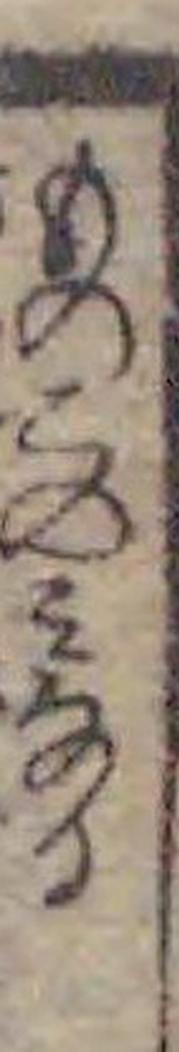ものこのみなる
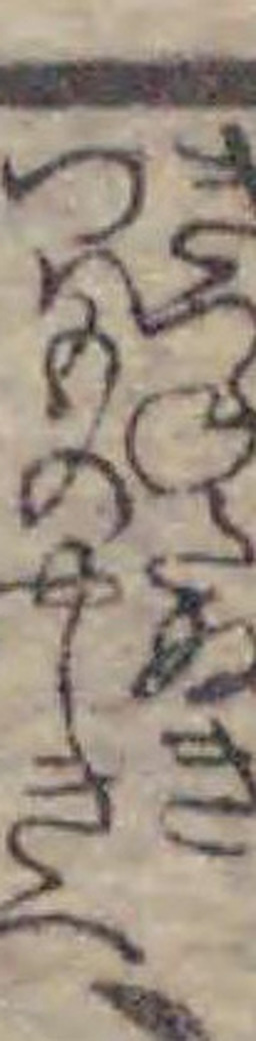つはものやしきへ
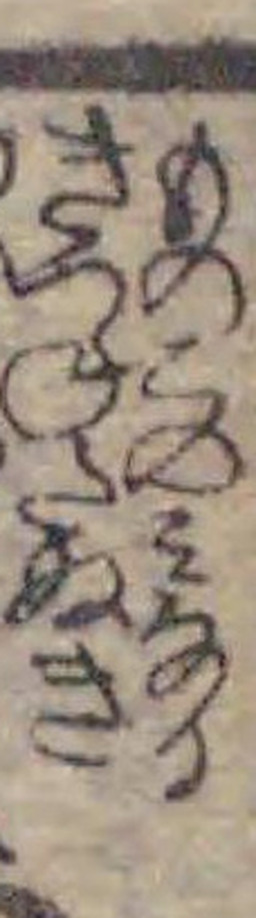きつねたぬき
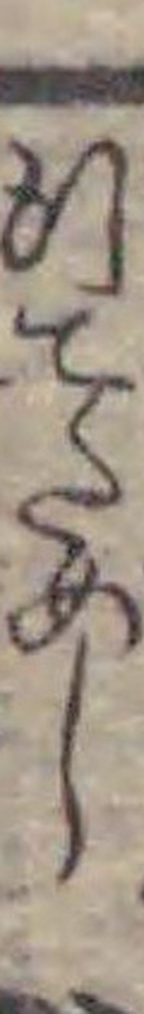行てためし
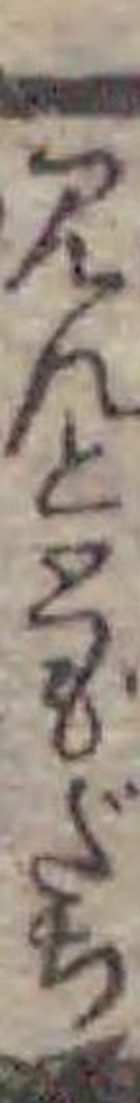見んとともだち
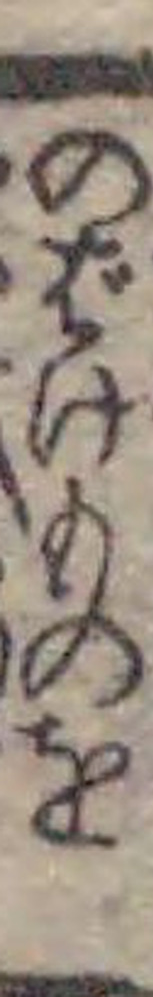のばけものを
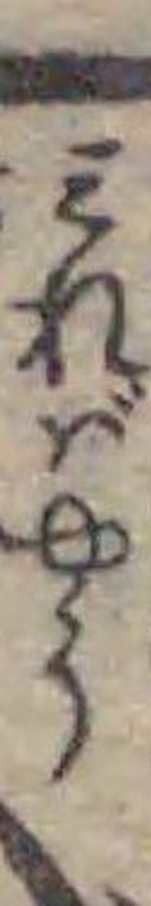みればやう
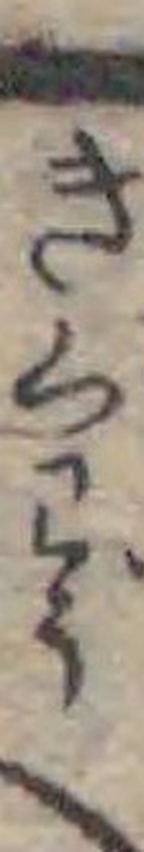きくわう
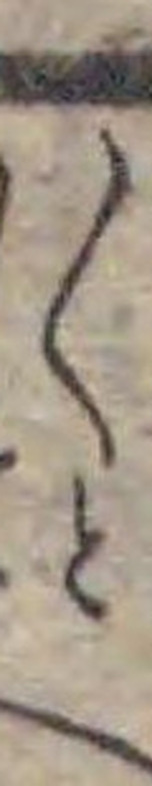〳〵と
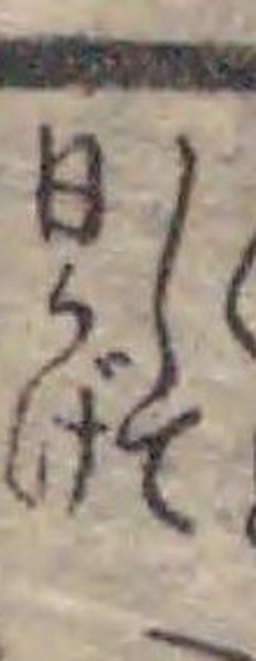日かげ
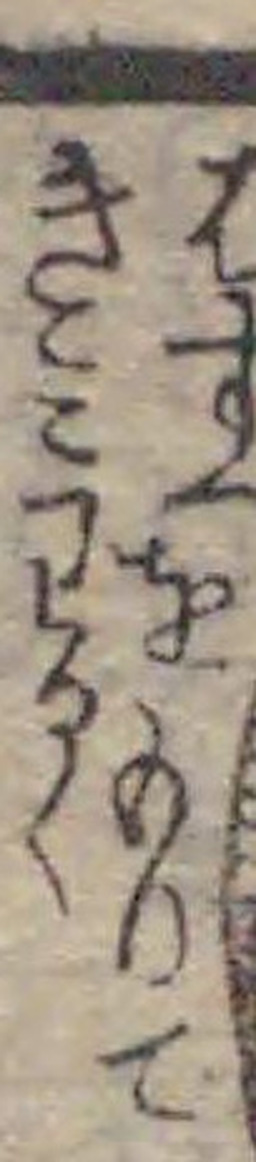きみわるく
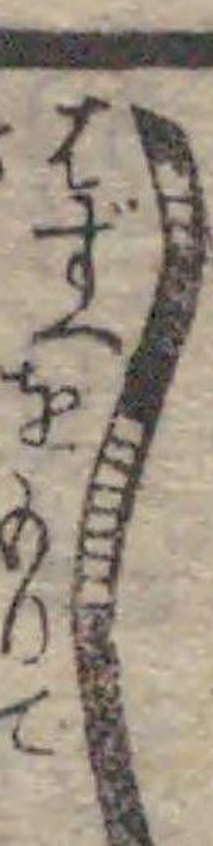はずへをもりて
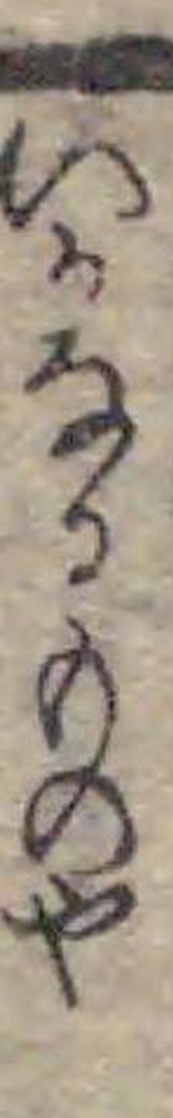いかなるものや
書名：怪物つれつれ草 : 2巻
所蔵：国立国会図書館 National Diet Library, JAPAN
